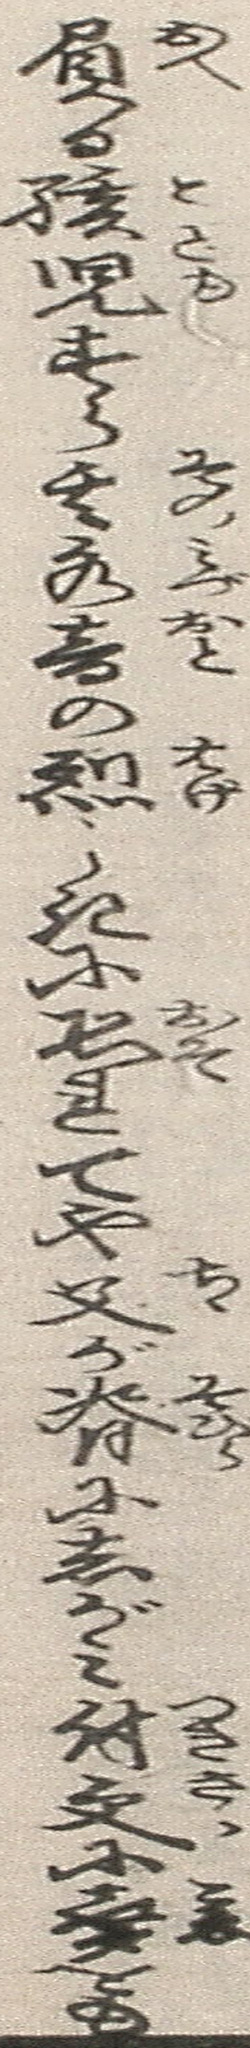負る孩児すら其水音の烈しきに恐てや父が背にしがミ付更に声をも
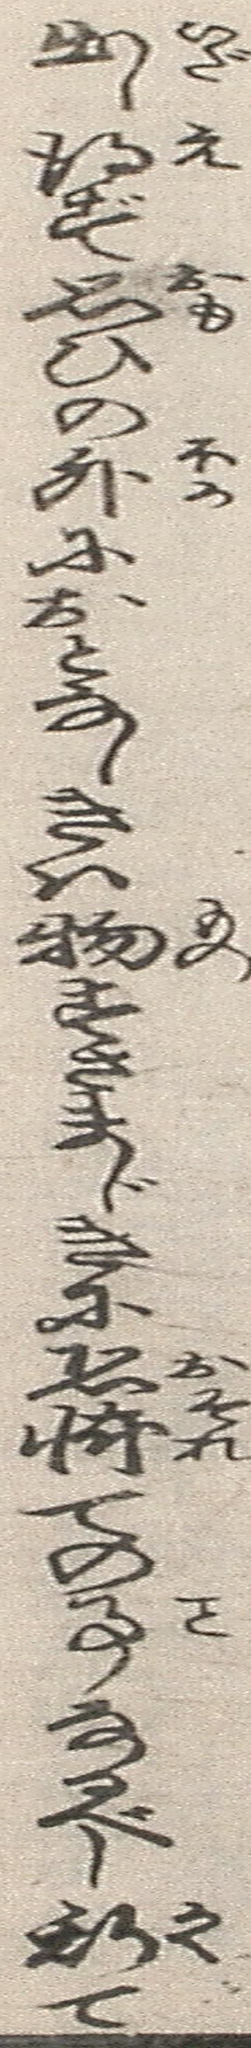出し得ず思ひの外におとなしきハ物すさまじきに恐怖ての事なるべし斯て
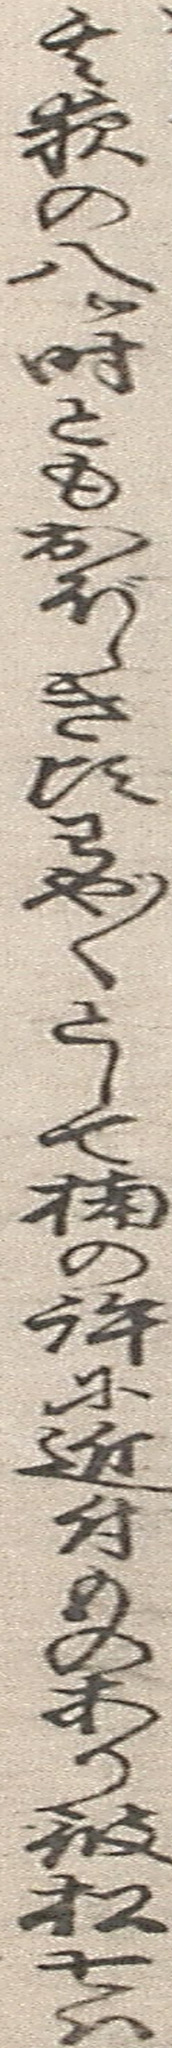其夜の八ッ時ともおぼしき頃わや〳〵として楠の許に近付ものあり彼松七ハ
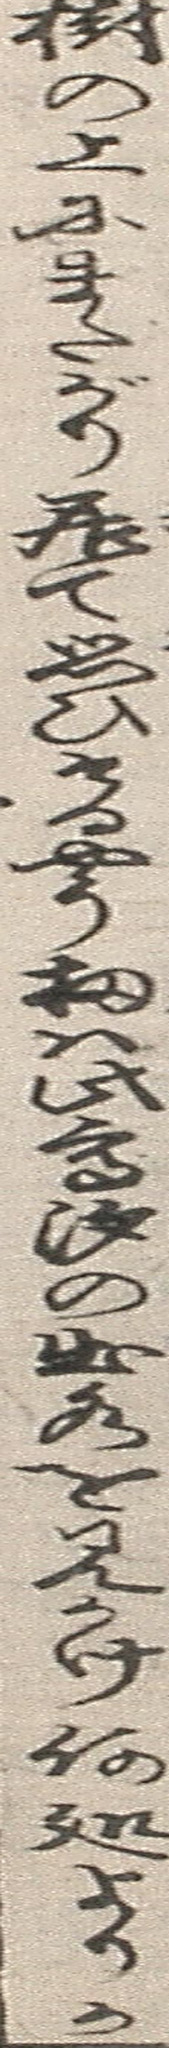樹の上にまたがり居て思ひけるやう扨ハ此高汐の出水を見かけ何処よりか
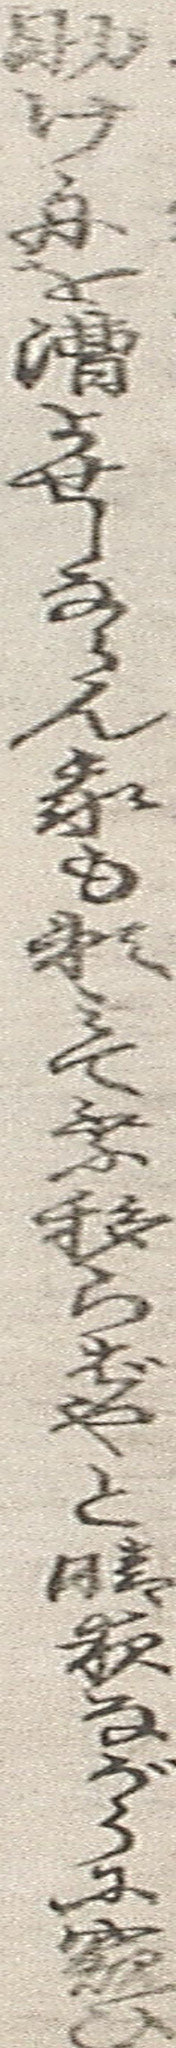助け舟を漕よせならん我も頼ミて乗移らばやと暗夜ながらに窺ひ
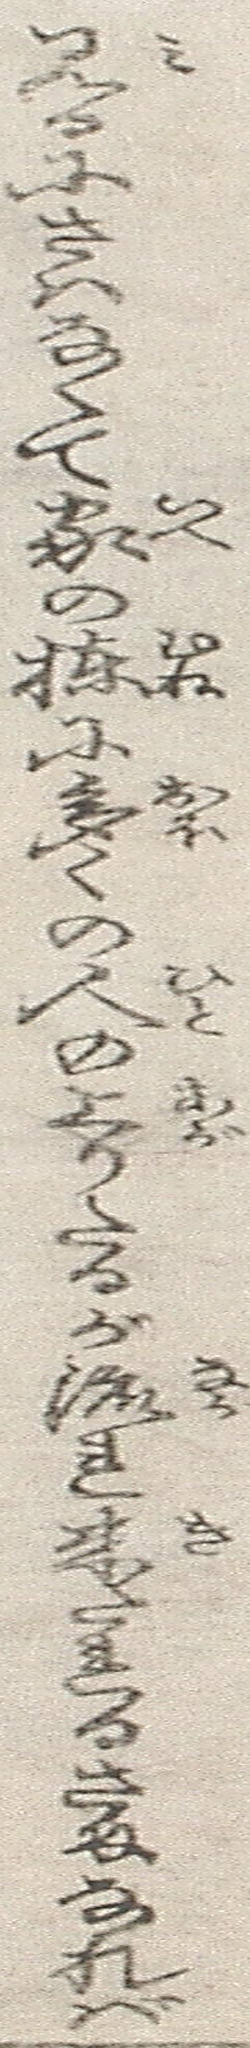見るにさハなくて家の棟に多くの人の上りたるが流れ来たれるさまなれバ
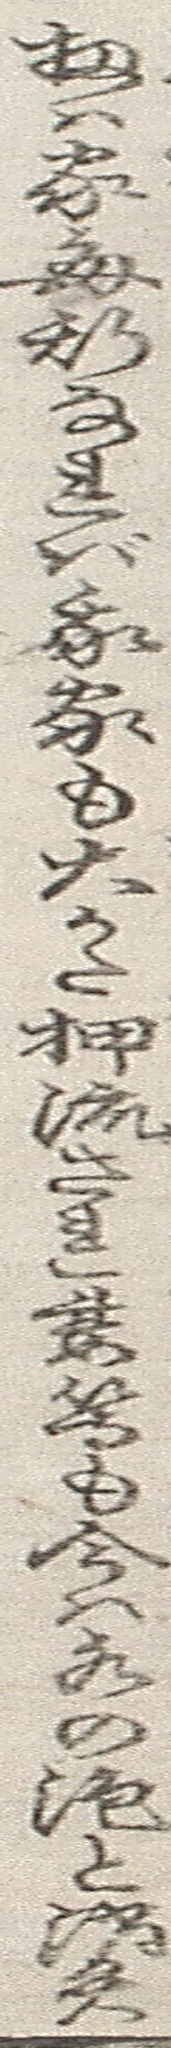扨ハ家毎斯なれバ我家も大かた押流され妻等も今ハ水の泡と消失
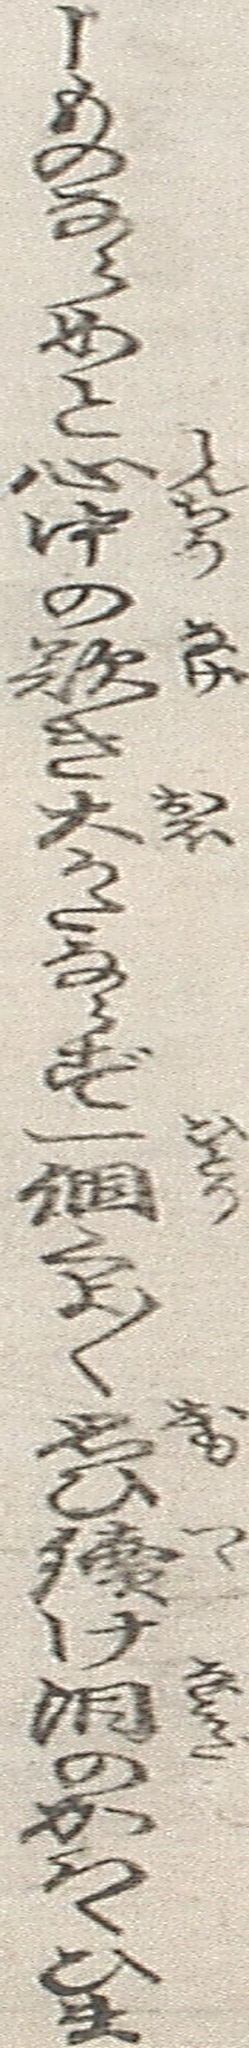しものならめと心中の歎き大かたならず一個くよ〳〵思ひ続け泪のかハくひま
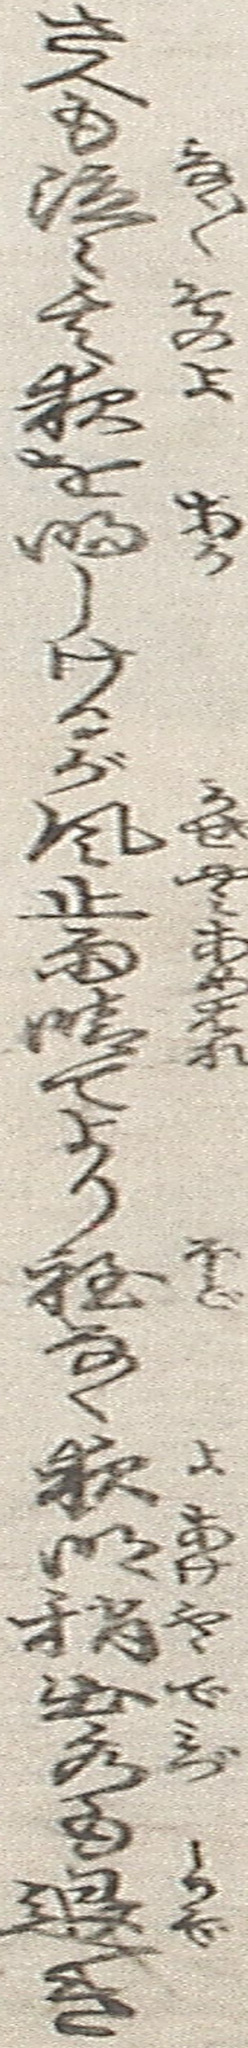さへも泣し其夜を明しけるが風止雨晴てより程なく夜明稍出水も退き
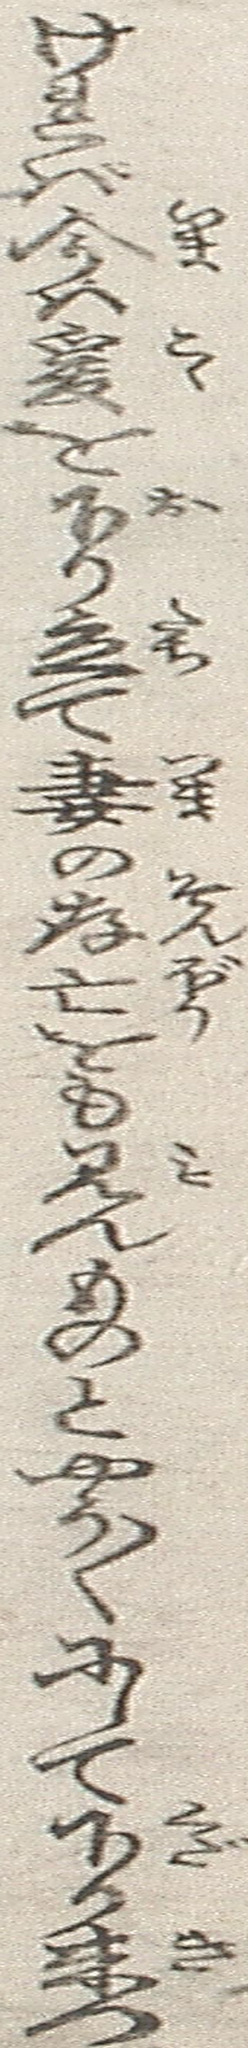けれバ今ハ爰を下り立て妻の存亡をも見んものとやう〳〵にて下り来つ
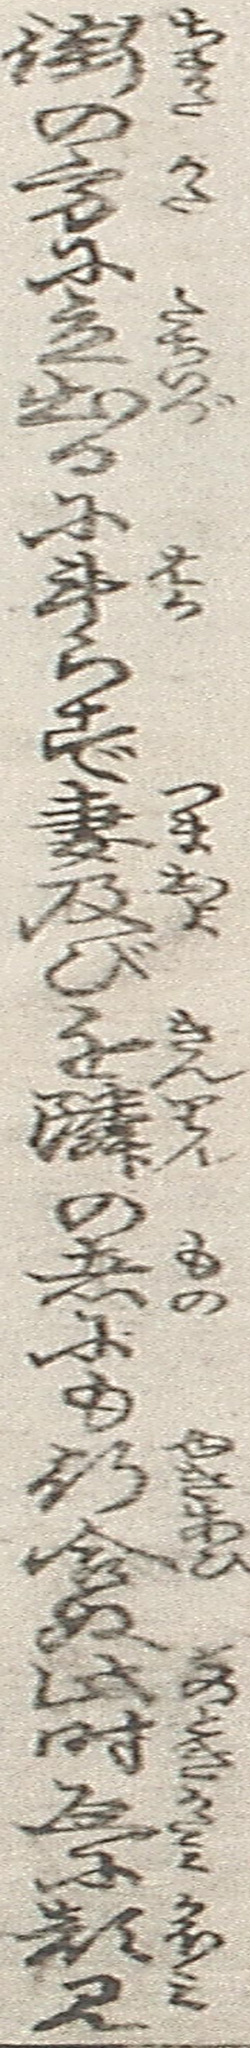街の方に立出るに斗らず妻及び近隣の者にも行合ぬ此時互に顔見
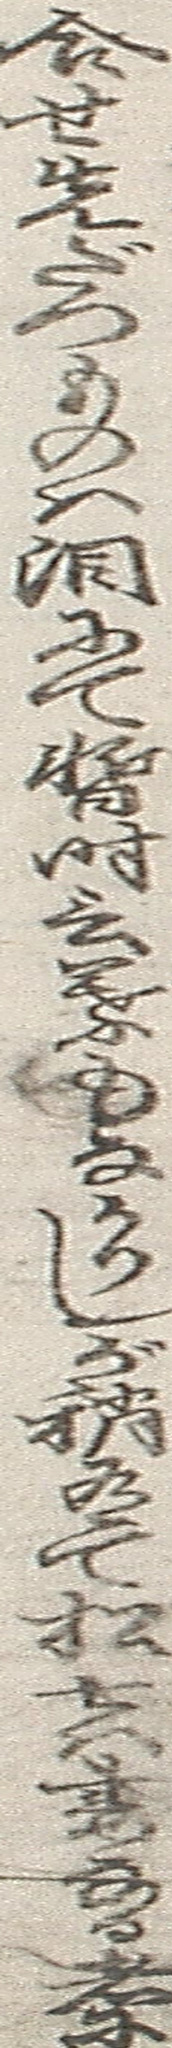合せ先だつものハ泪にて暫時言葉もなかりしが稍有て松七ハ妻なる者に
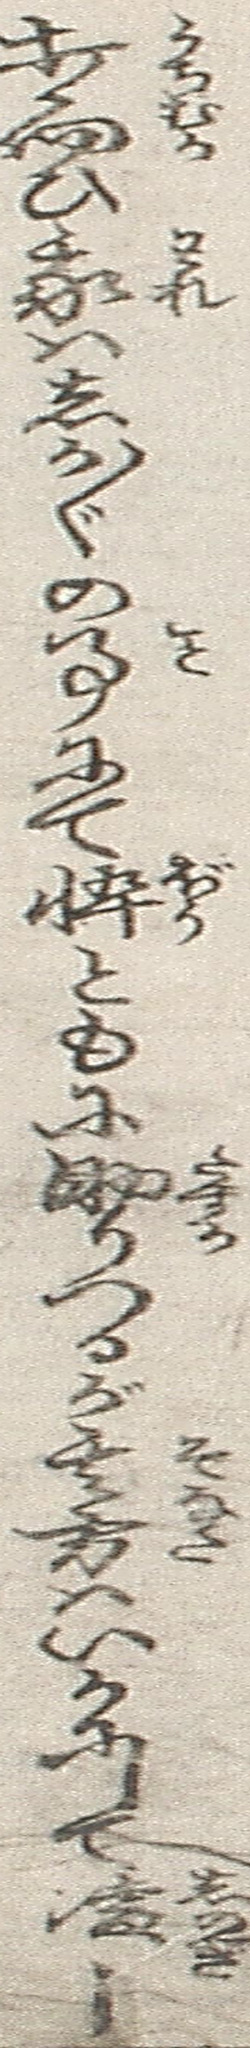打向ひ我ハしか〴〵の事に忰ともに助りつるが其方ハいかなして凌し
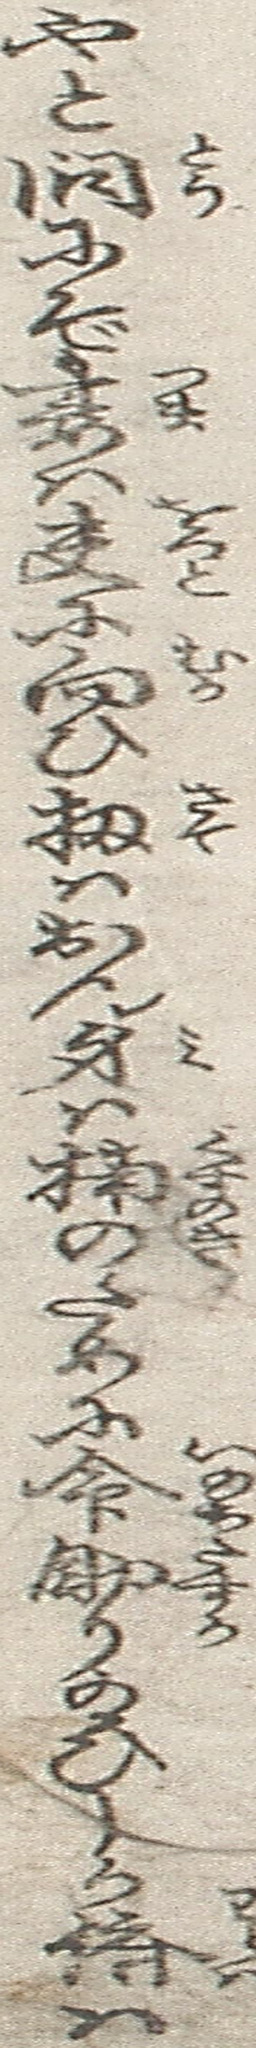やと問にぞ妻ハ夫に向ひ扨ハおん身ハ楠のために命助り給ひしか儕ハ
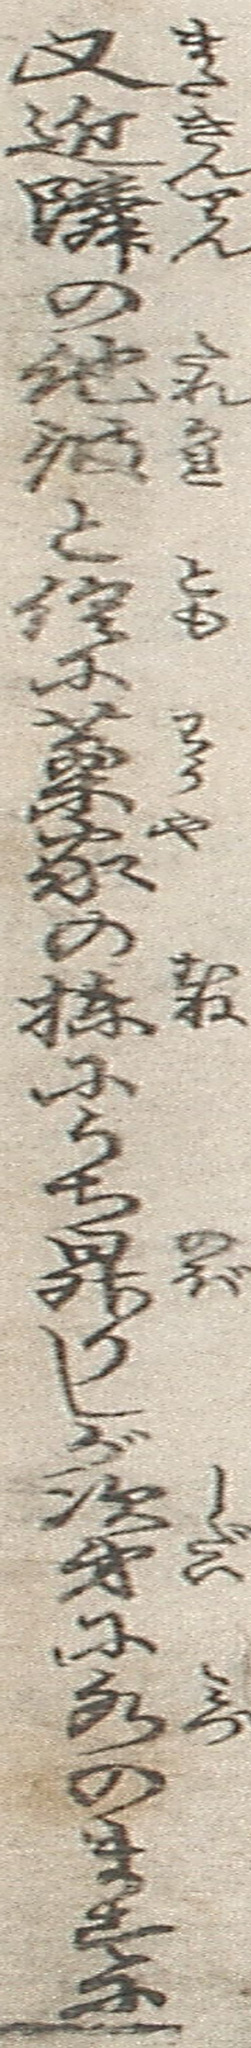又近隣の他彼と倶に藁家の棟にうち登りしが次第に水のますに

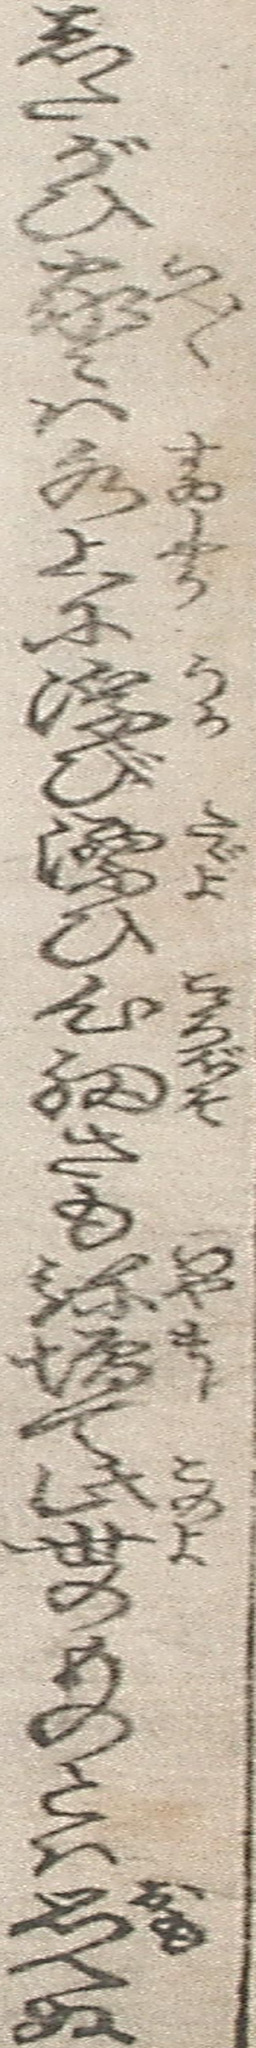したがひ家々ハ水上に浮び漂ひ心細さも弥増て此世のものとハ思へぬ
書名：安政風聞集　上中下　全
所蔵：東京大学地震研究所図書室 Earthquake Research Institute Library, The University of Tokyo, JAPAN
